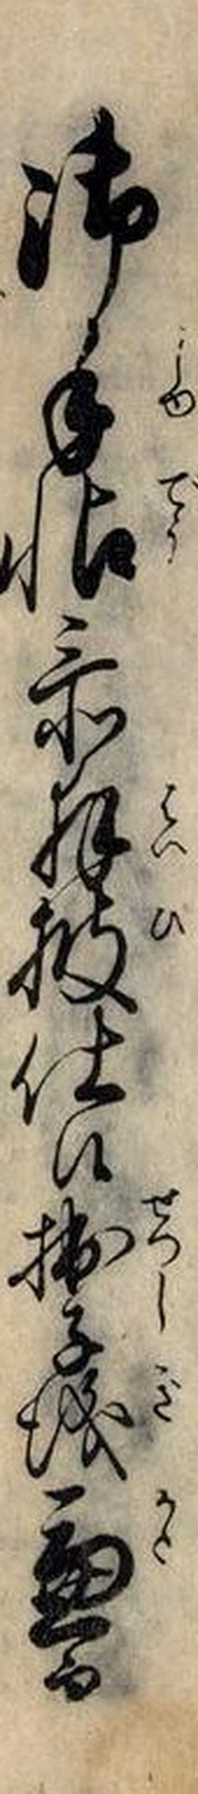御手帖忝拝披仕候拙子儀兼而
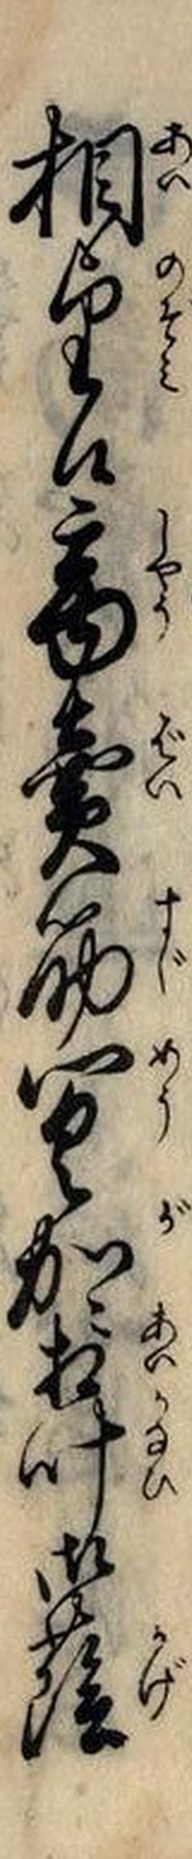相望候商賣筋冥加に相叶御蔭
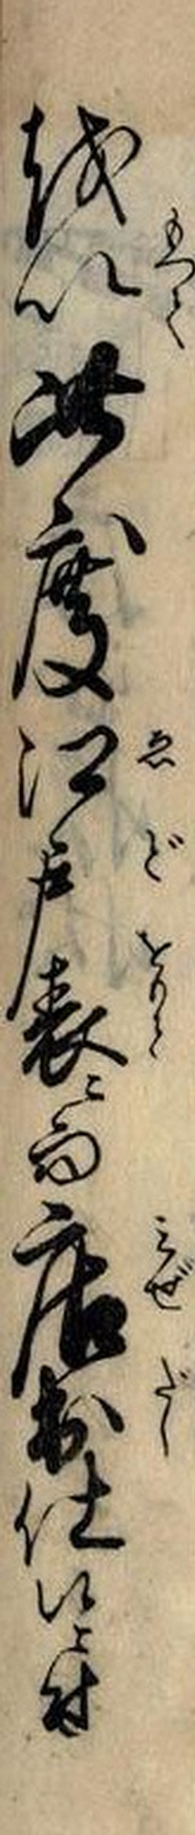を以此度江戸表に而店出仕候に付
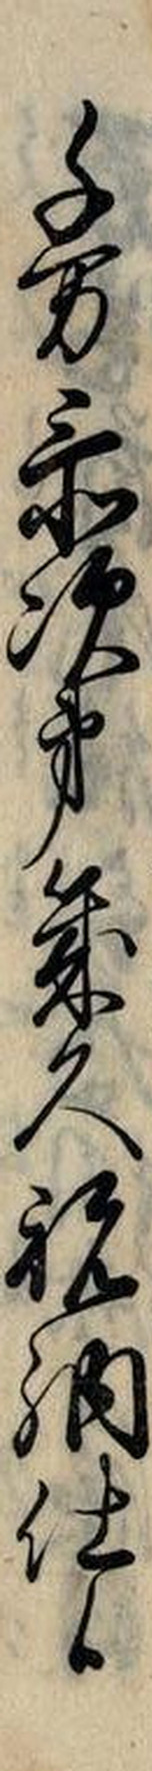千万忝次第幾久祝納仕候
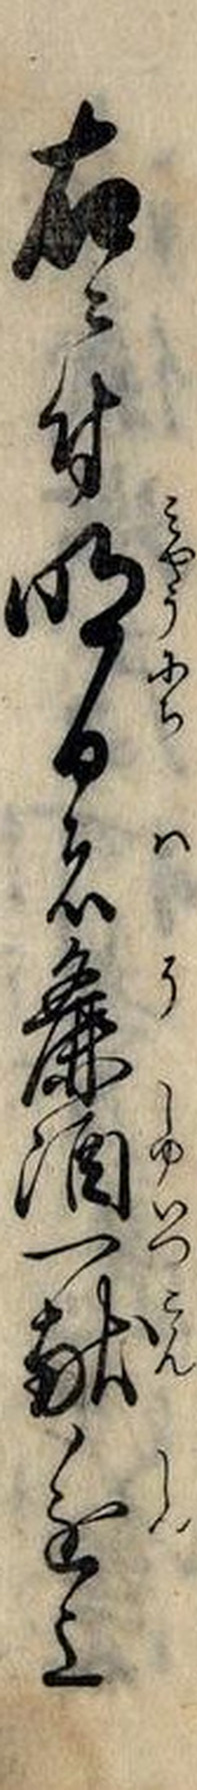右に付明日者麁酒一献進上
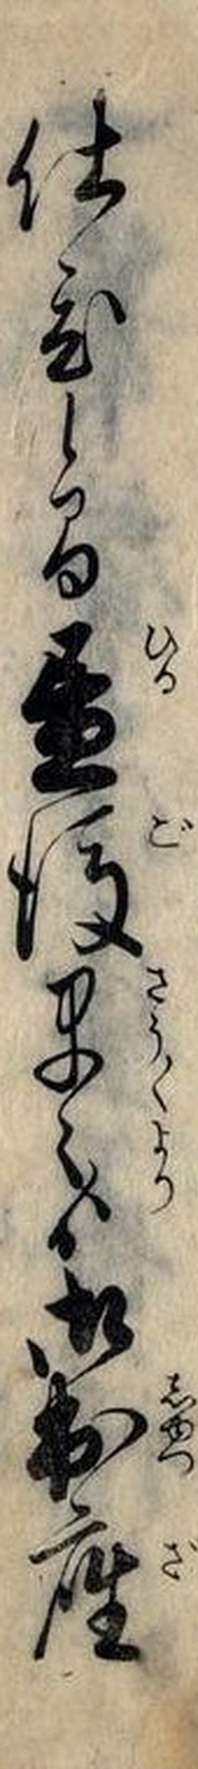仕度候間昼後早々ゟ御出座
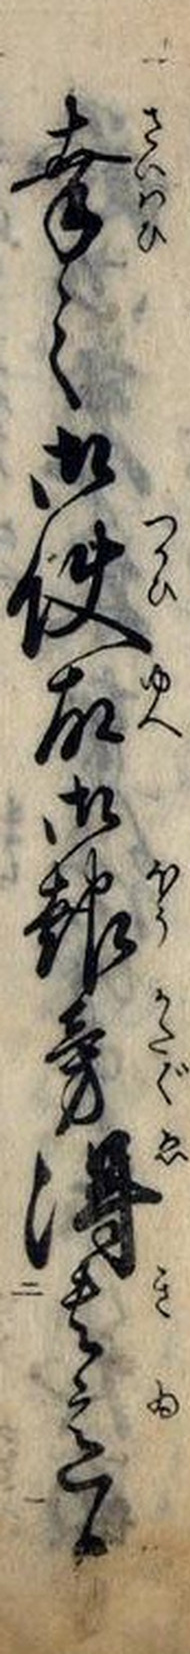幸之御使故御報旁得貴意候

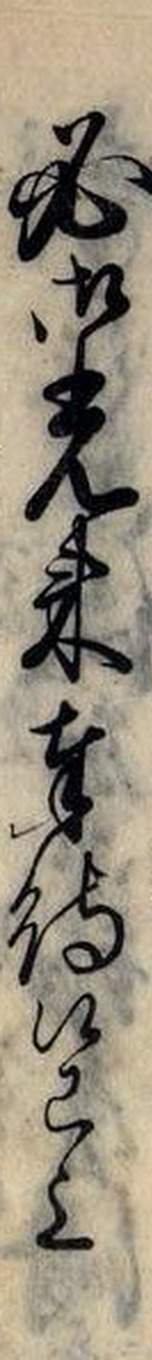必御光来奉待候已上
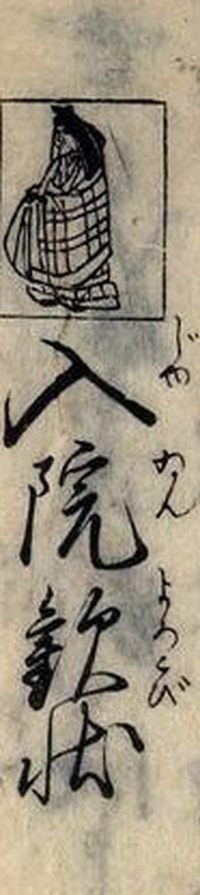入院歓状
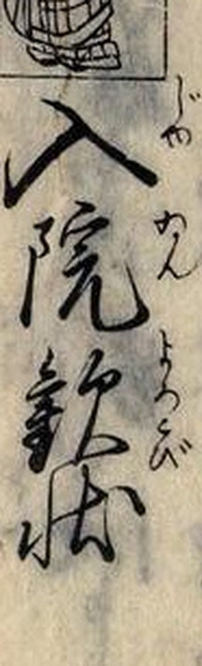入院歓状
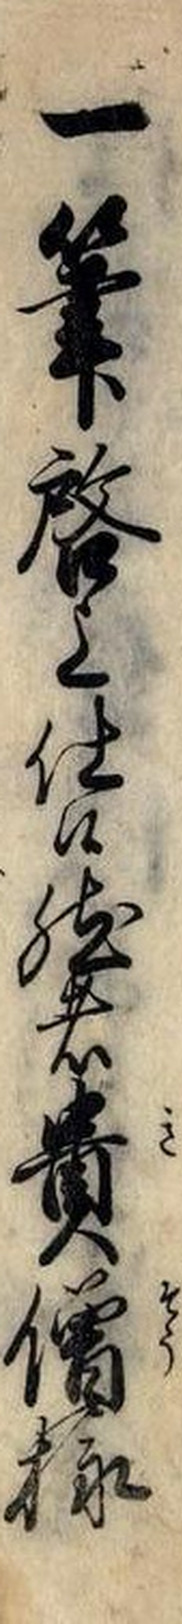一筆啓上仕候然者貴僧様
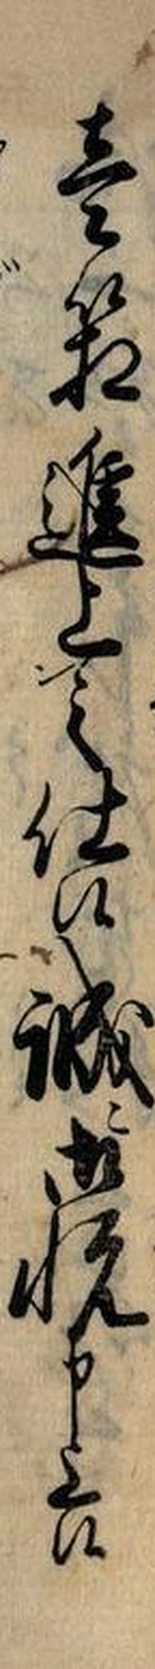壱箱進上之仕候誠に御悦申上候
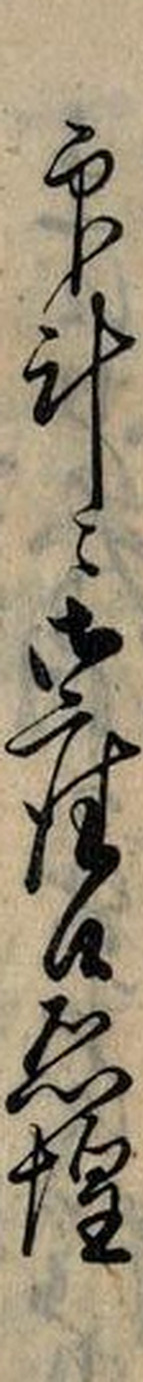印斗に御座候恐惶
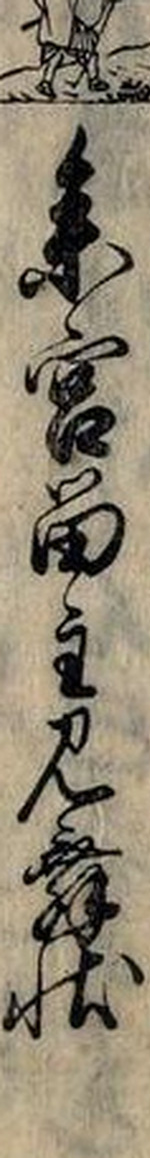参宮留主見舞状
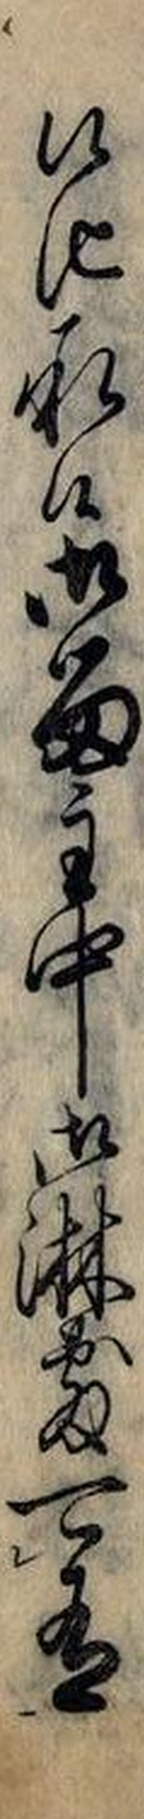候由承候御留主中御淋敷可有

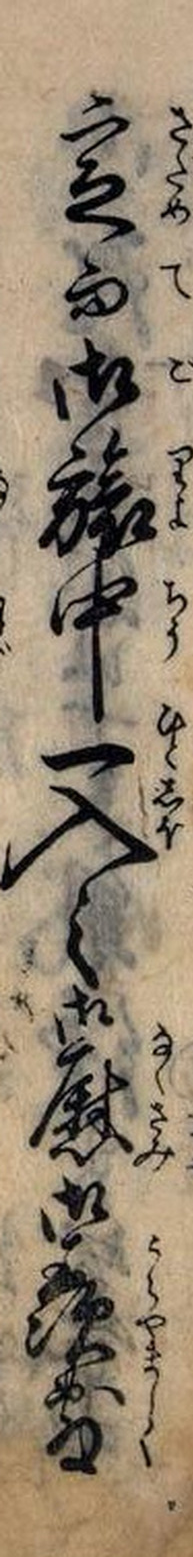定而御旅中一入之御慰御羨敷
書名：大成用文章（往来物）
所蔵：福井県文書館 Fukui Prefectural Archives
